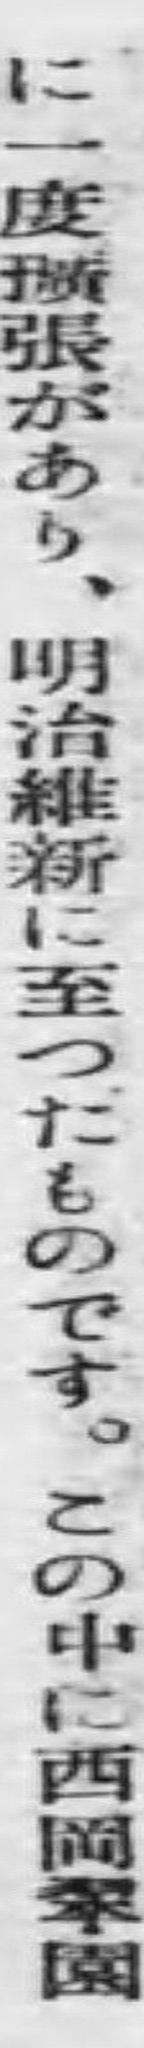に一度拡張があり、明治維新に至つたものです。この中に西岡翠園
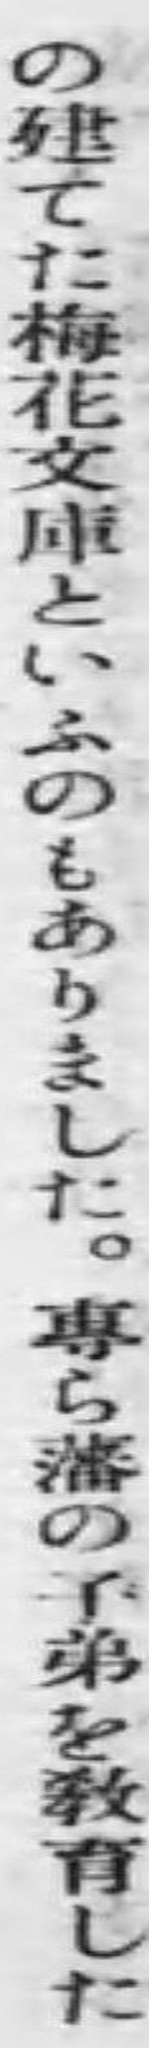の建てた梅花文庫といふのもありました。専ら藩の子弟を教育した

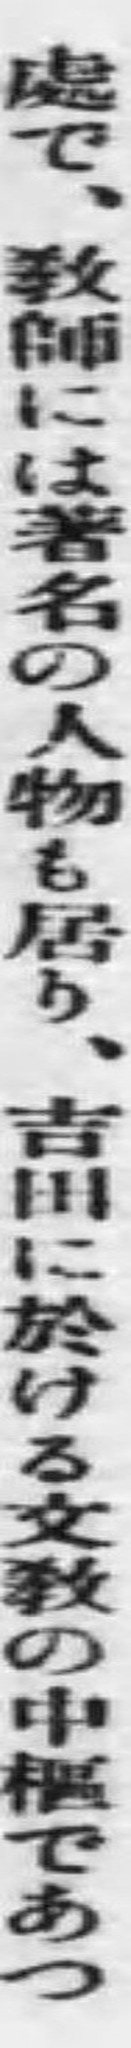処で、教師には著名の人物も居り、吉田に於ける文教の中枢であつ
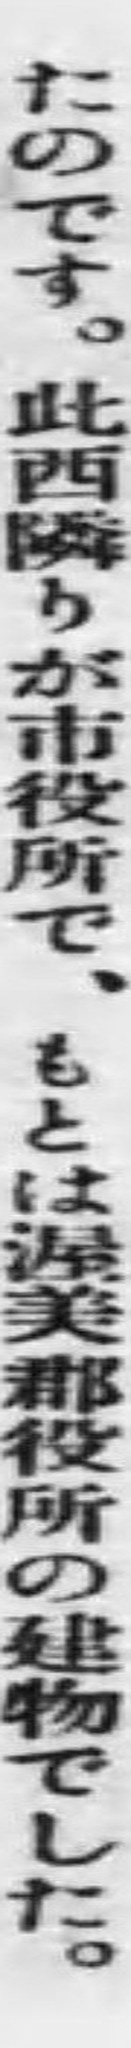たのです。此西隣りが市役所で、もとは渥美郡役所の建物でした。
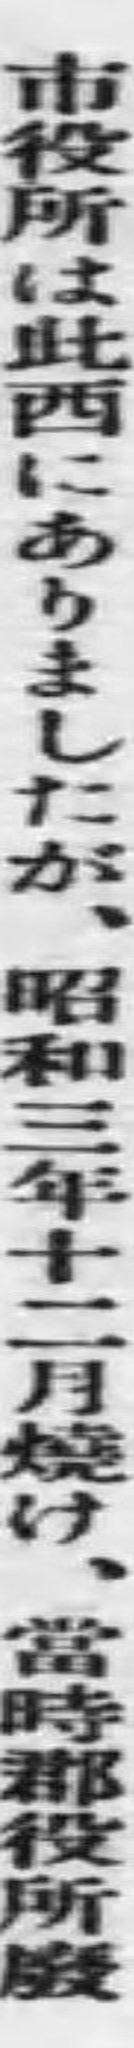市役所は此西にありましたが、昭和三年十二月焼け、当時郡役所廃
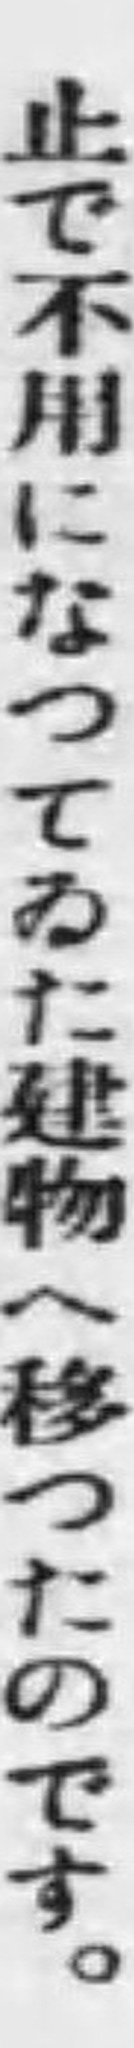止で不用になつてゐた建物へ移つたのです。
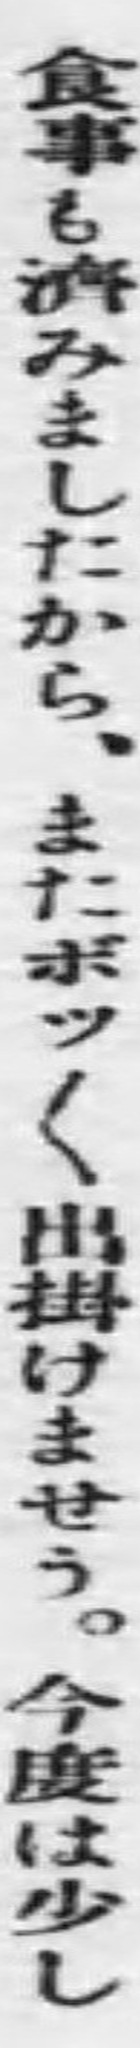食事も済みましたから、またボツ〳〵出掛けませう。今度は少し
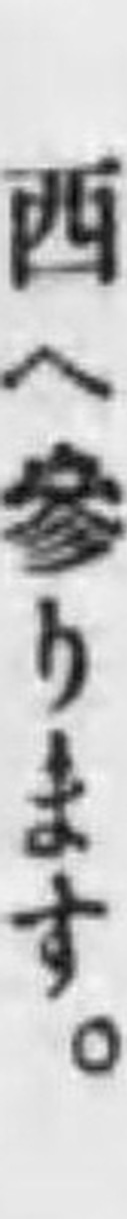西へ参ります。
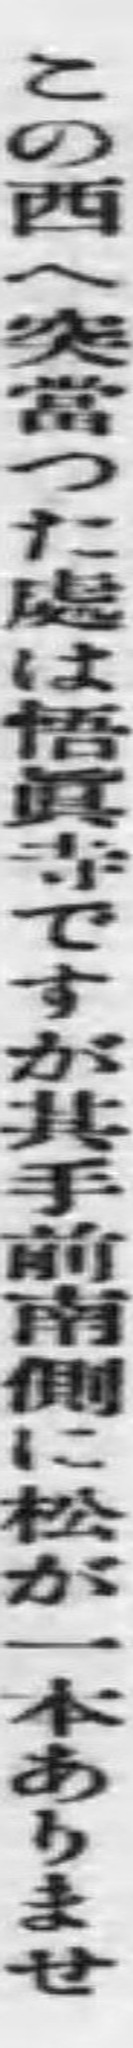この西へ突当つた処は悟真寺ですが其手前南側に松が一本ありませ
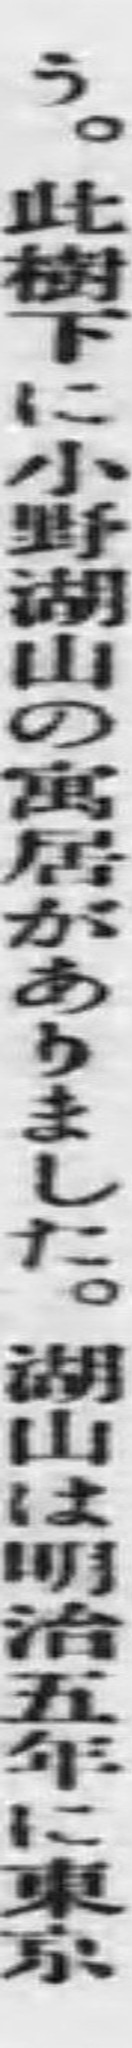う。此樹下に小野湖山の寓居がありました。湖山は明治五年に東京
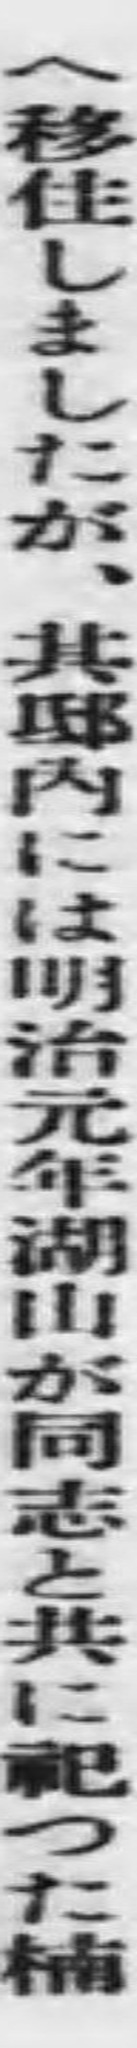へ移住しましたが、其邸内には明治元年湖山が同志と共に祀つた楠
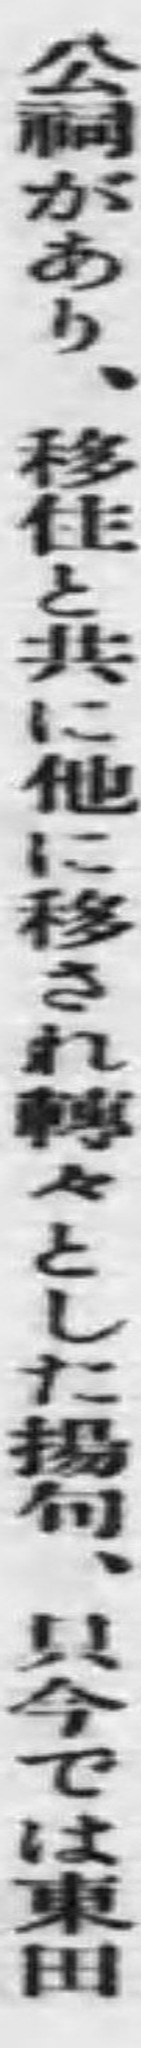公祠があり、移住と共に他に移され転々とした揚句、只今では東田
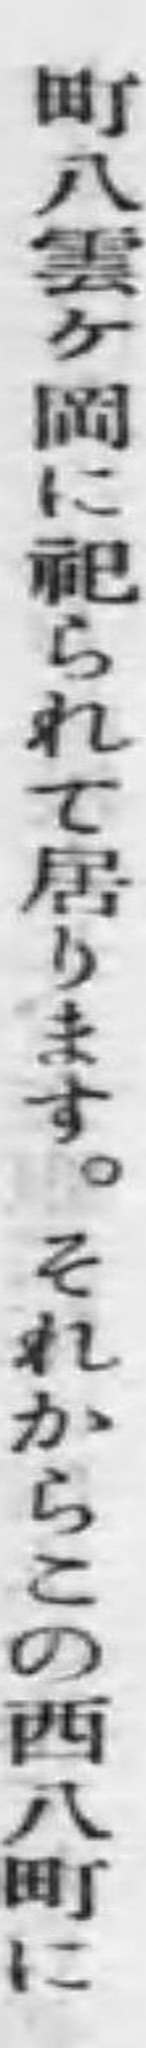町八雲ヶ岡に祀られて居ります。それからこの西八町に
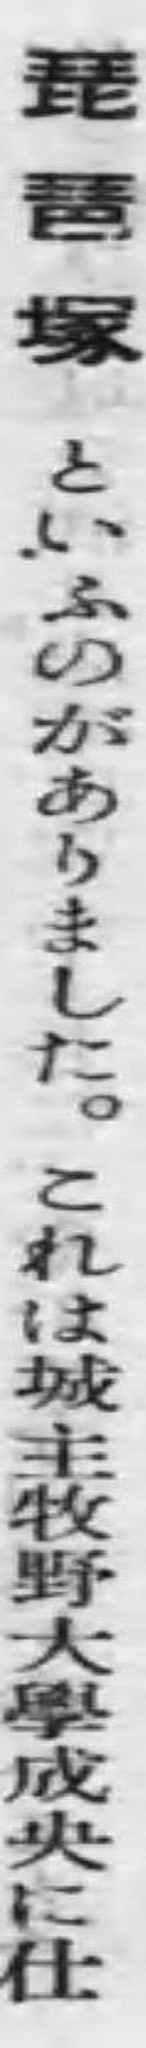琵琶塚といふのがありました。これは城主牧野大学成央に仕
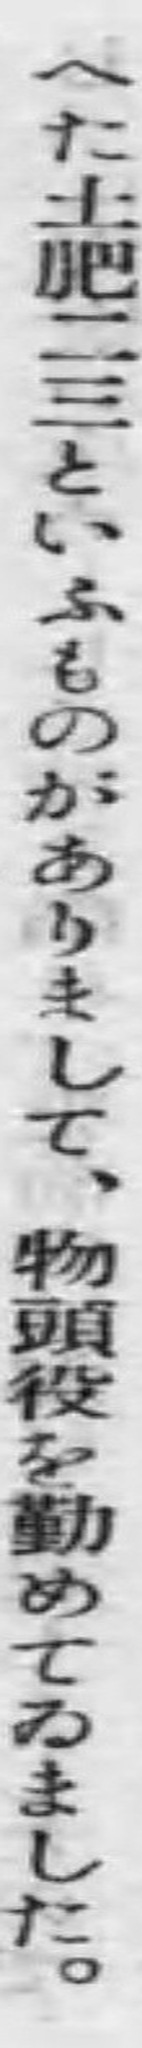へた土肥二三といふものがありまして、物頭役を勤めてゐました。
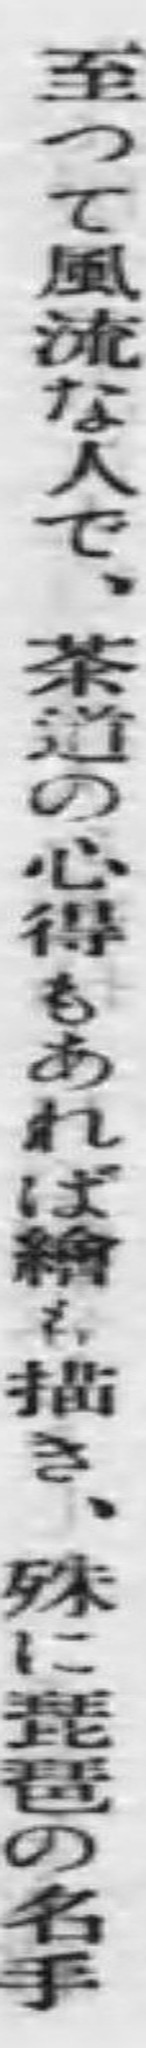至つて風流な人で、茶道の心得もあれば絵も描き、殊に琵琶の名手
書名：東三河道中記 : 豊橋市及其附近案内
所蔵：国立国会図書館 National Diet Library, JAPAN
